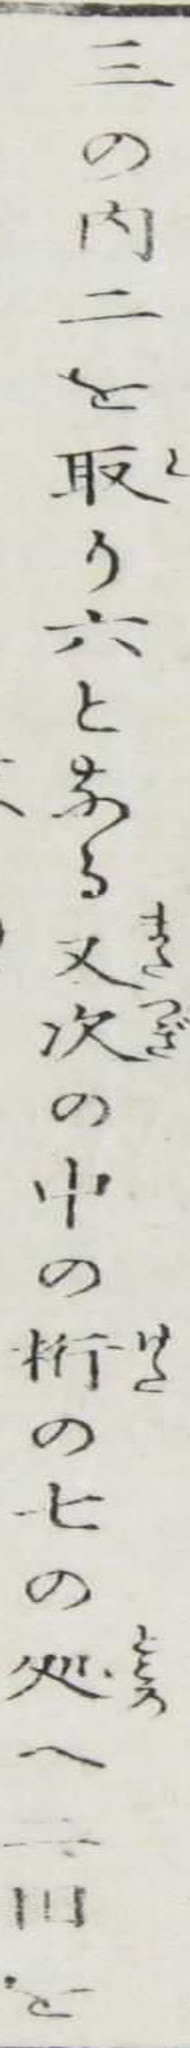三の内二を取り六となる又次の中の桁の七の処へ二円を
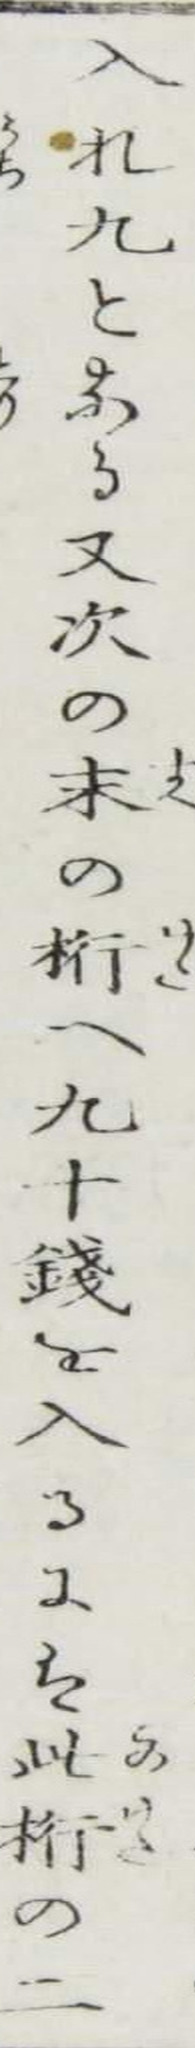入れ九となる又次の末の桁へ九十銭を入るには此桁の二
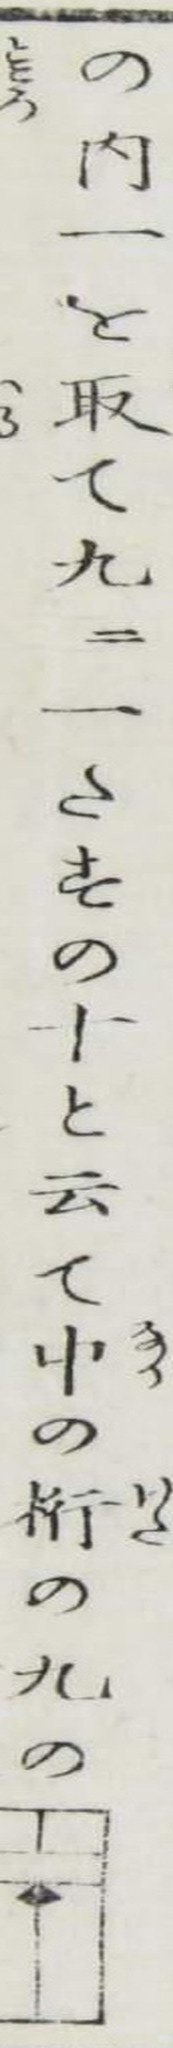の内一を取て九ニ一たすの十と云て中の桁の九の
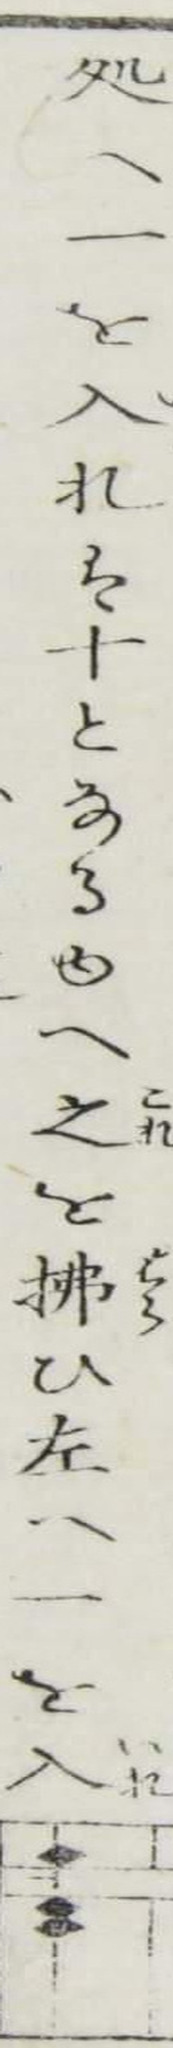処へ一を入れは十となるゆへ之を払左へ一を入
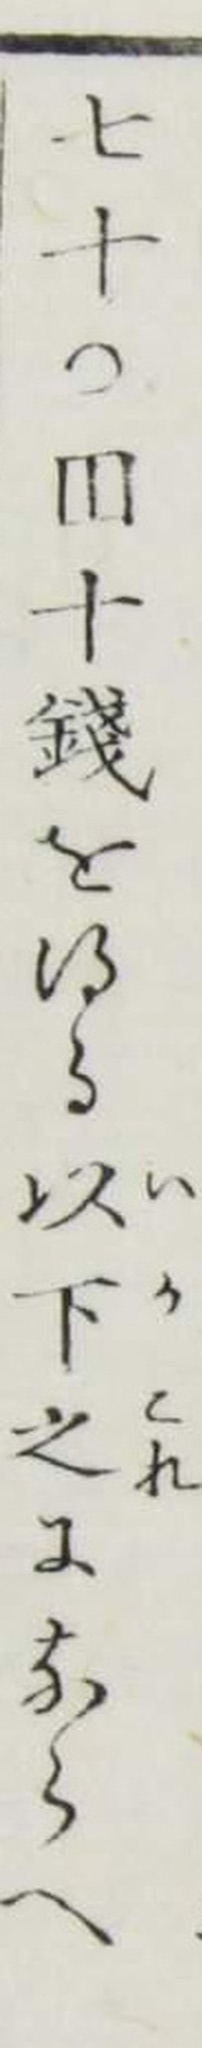七十〇円十銭を得る以下之にならへ
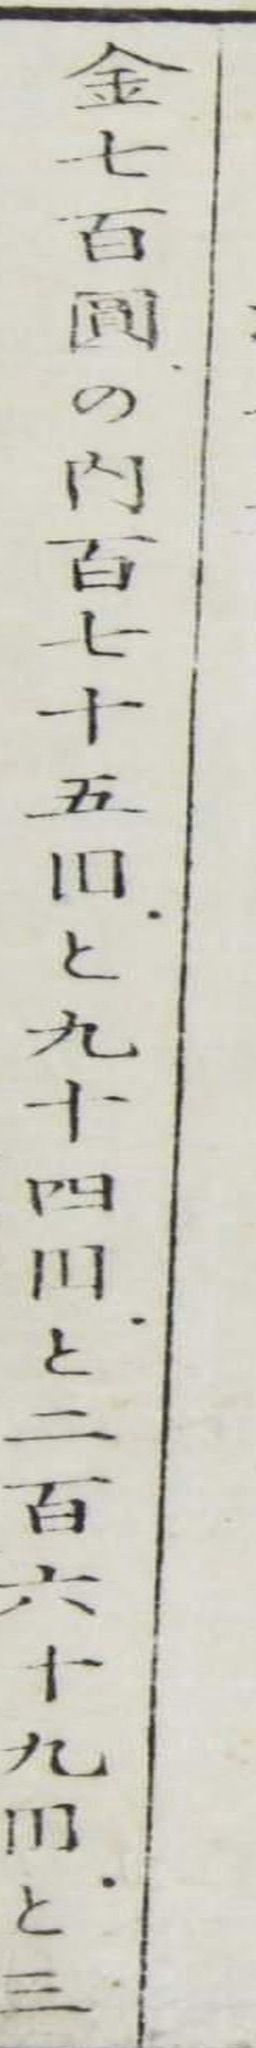金七百円の内百七十五円．と九十四円．と二百六十九円．と三
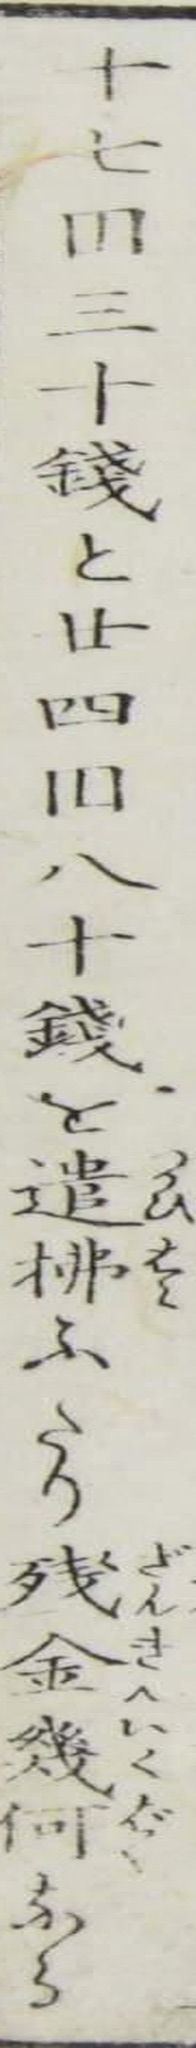十七円三十銭と廿四円八十銭．を遣払ふたり残金幾何なる

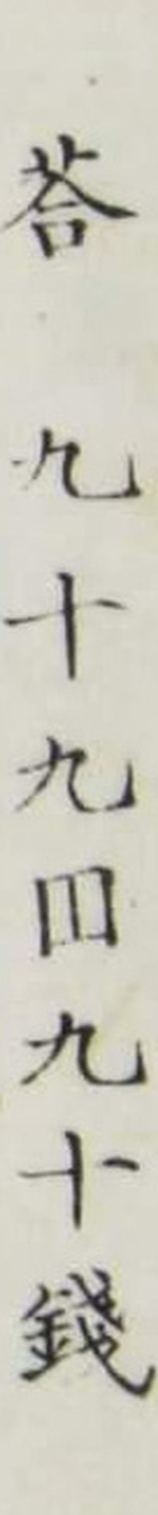や答九十九円九十銭
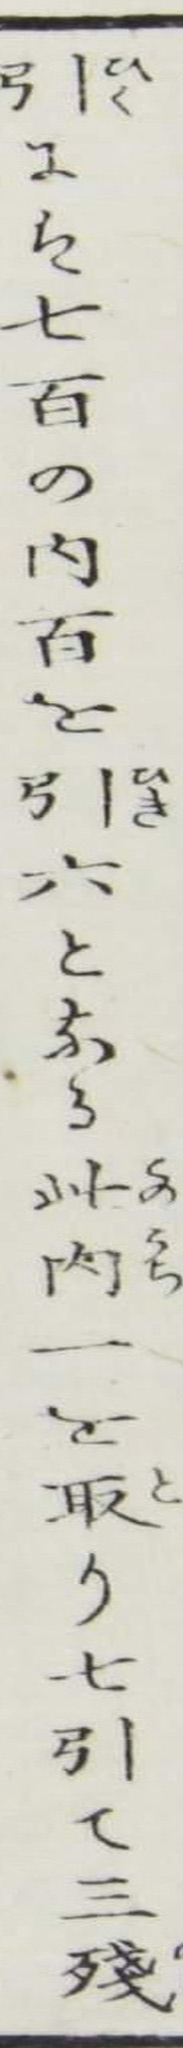引には七百の内百を引六となる此内一を取り七引て三残
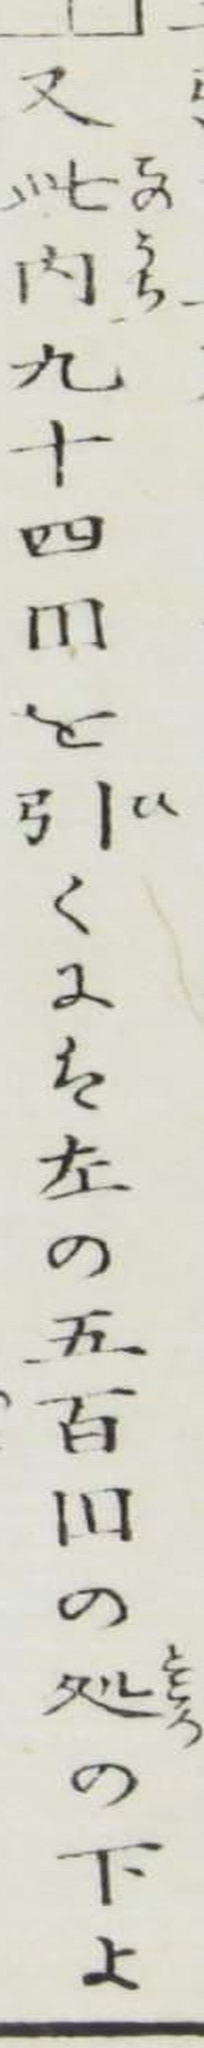又此内九十四円を引くには左の五百円の処の下よ
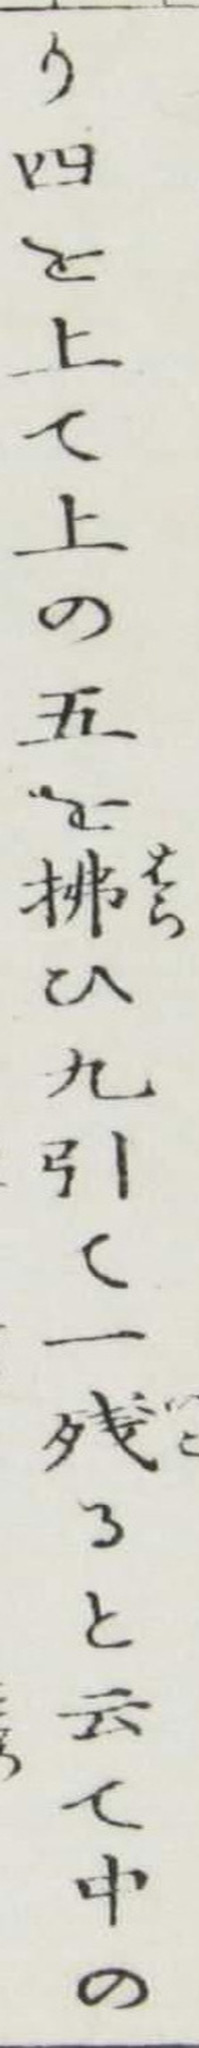り四を上て上の五を払ひ九引て一残ると云て中の
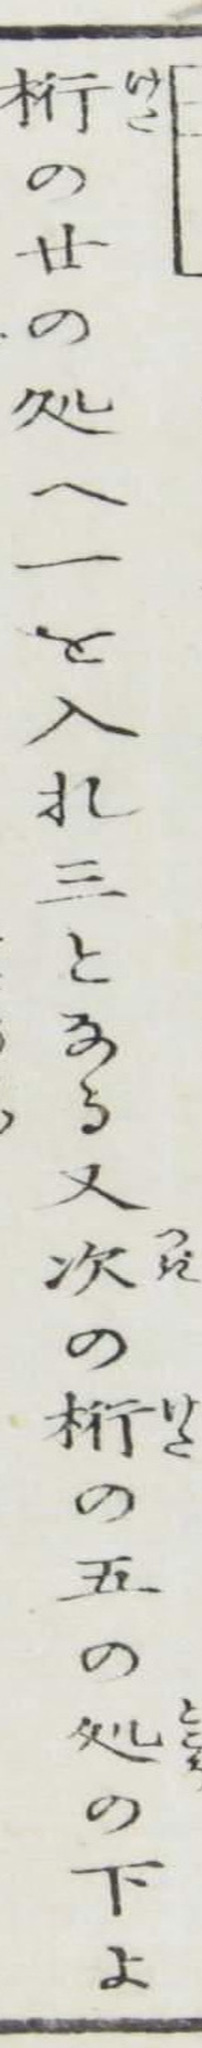桁の廿の処へ一を入れ三となる又次の桁の五の処の下よ
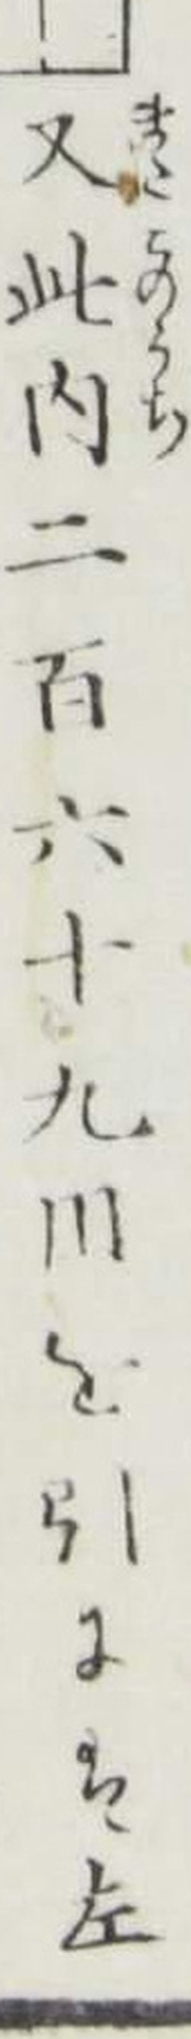又此内二百六十九円を引には左
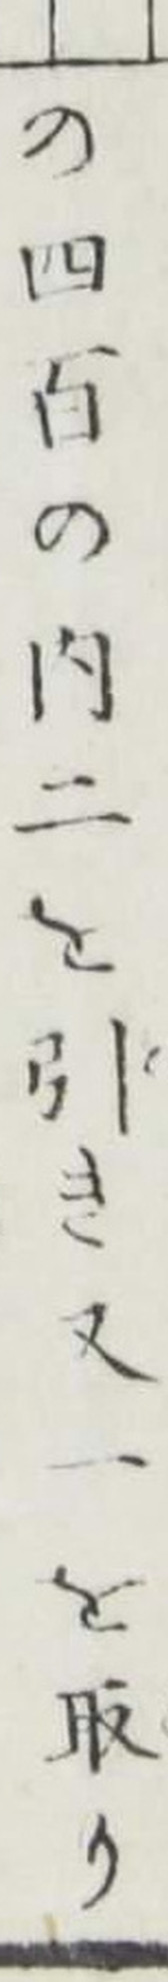の四百の内二を引き又一を取り
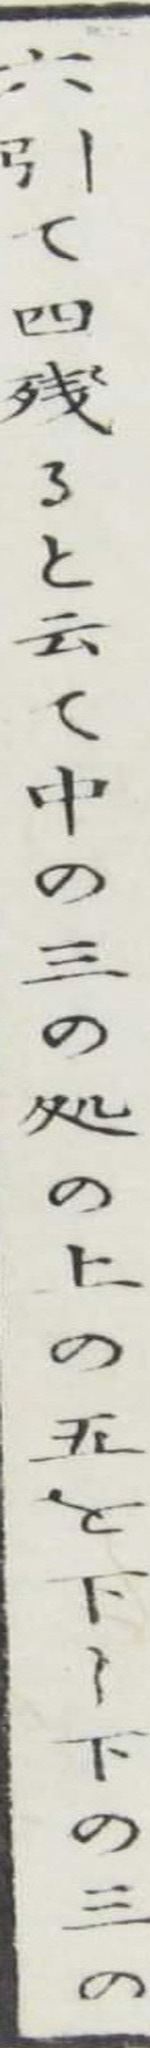六引て四残ると云て中の三の処の上の五を下し下の三の
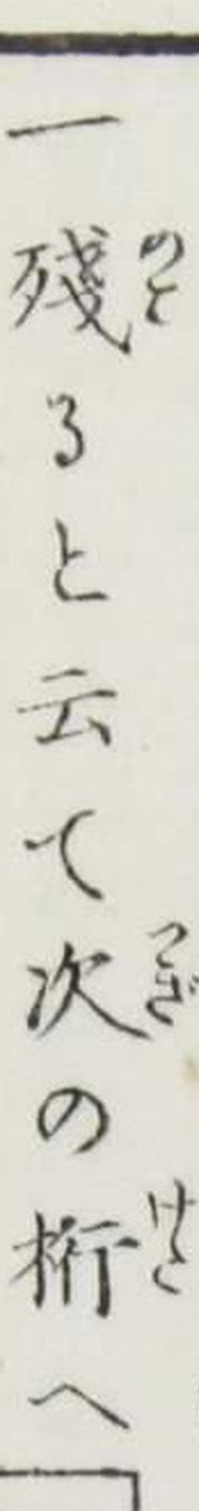一残ると云て次の桁へ
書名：明治小學塵劫記 卷1
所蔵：東京学芸大学教育コンテンツアーカイブ
